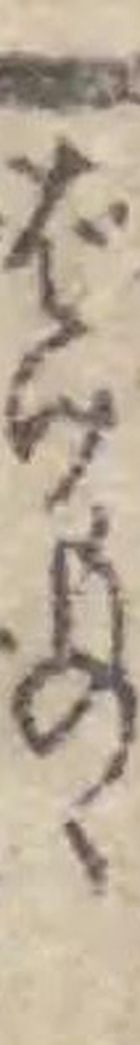ばけものゝ
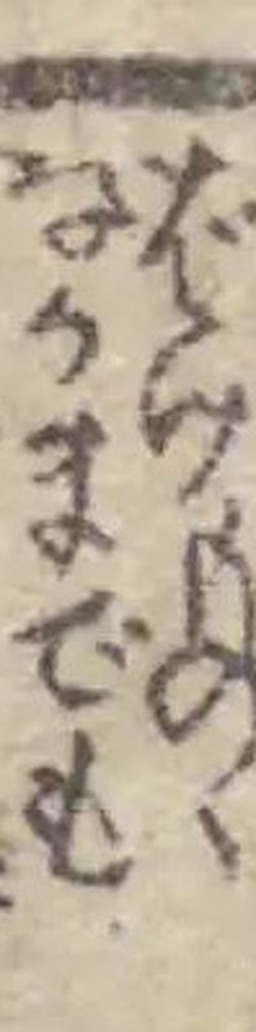なかまでも
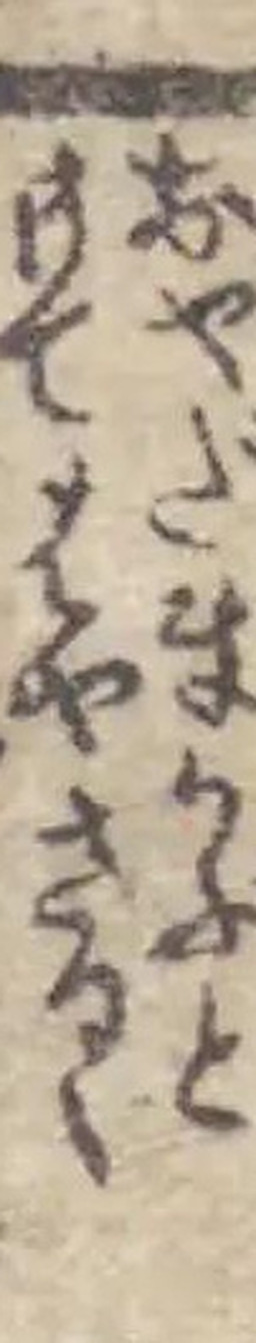もてはやさるゝ
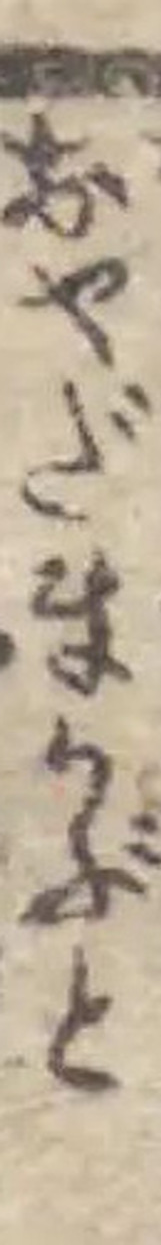おやだまかぶと
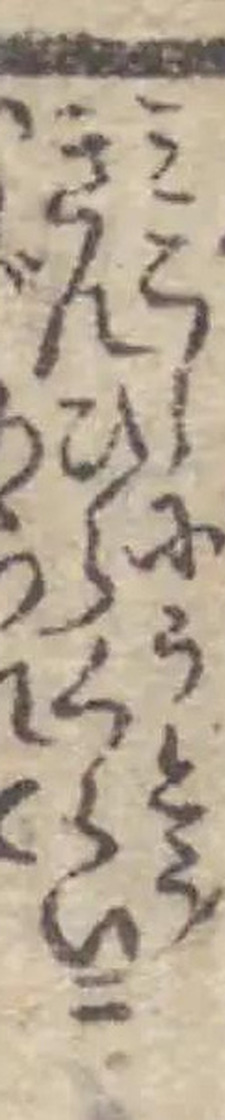きんひらくらいに
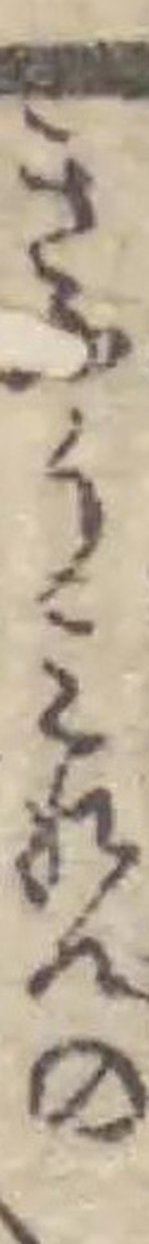きやうみれんの
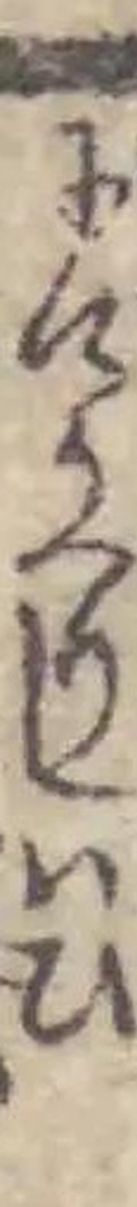にげかへりしはひ
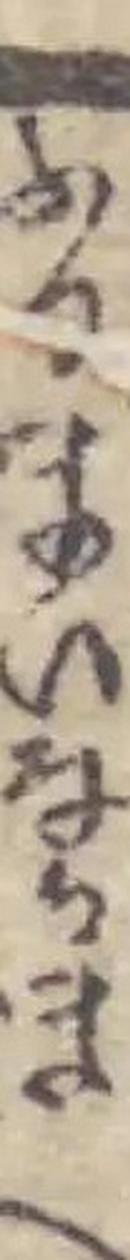ふるまいなかま
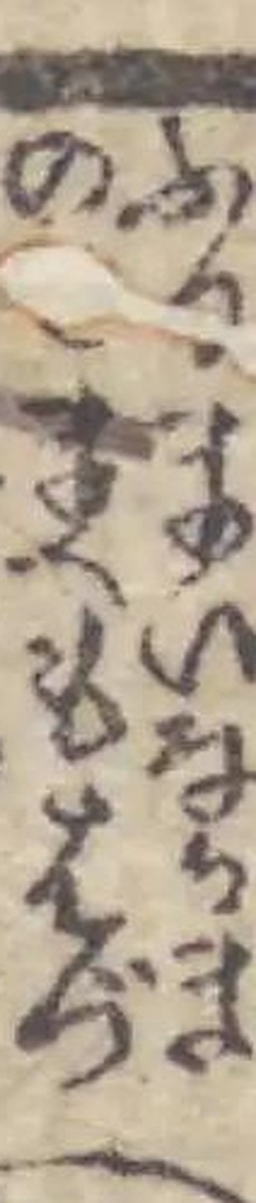のまへもはづ
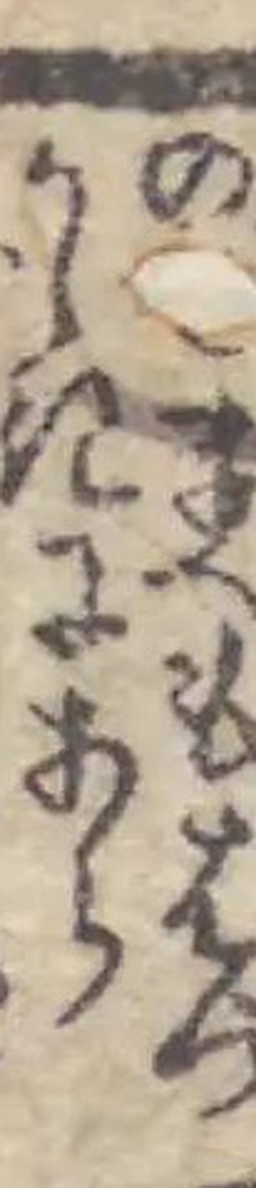かしきにあら
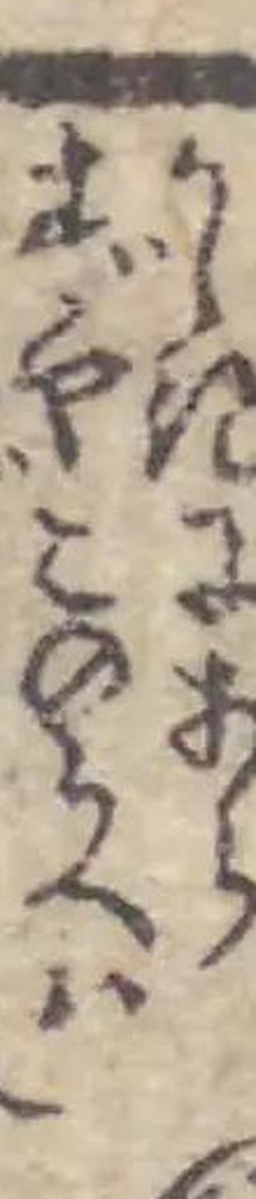ずやこのうへは
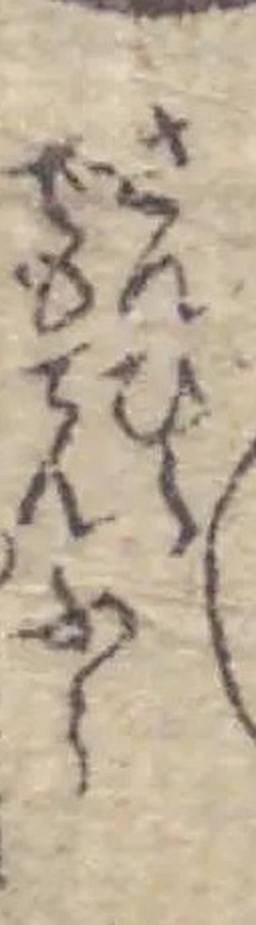でもてんふら
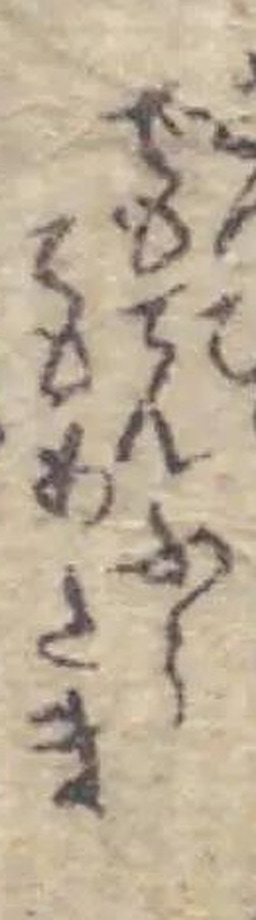でもあたま
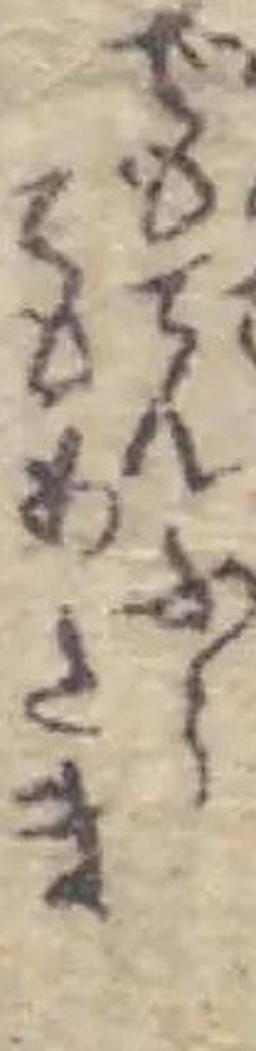でもあたま
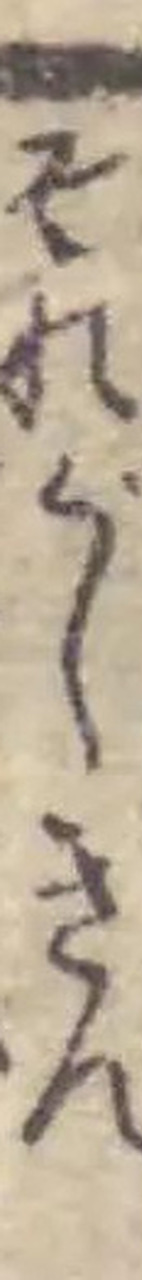それがしきん
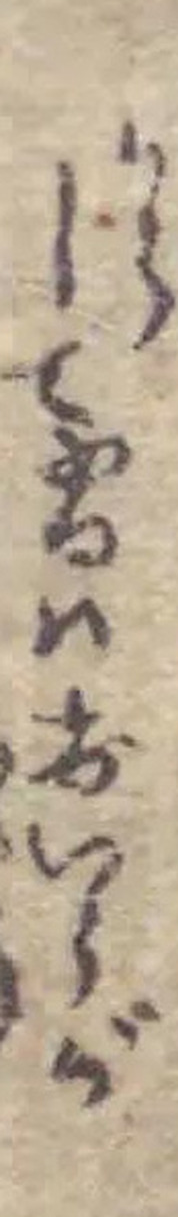してやるはおいらが
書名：化物尽 4巻
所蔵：国立国会図書館 National Diet Library, JAPAN
